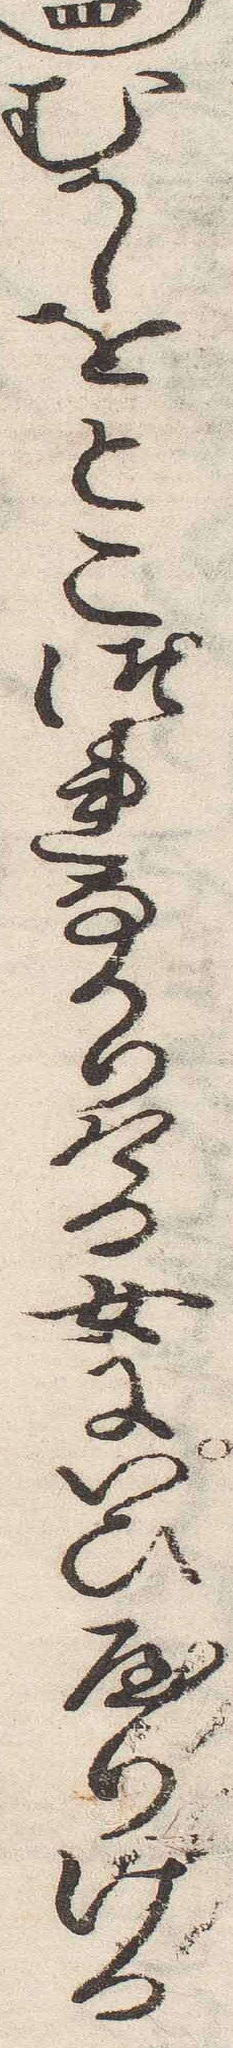五十四むかしをとこ。つれなかりける女に。いひやりける
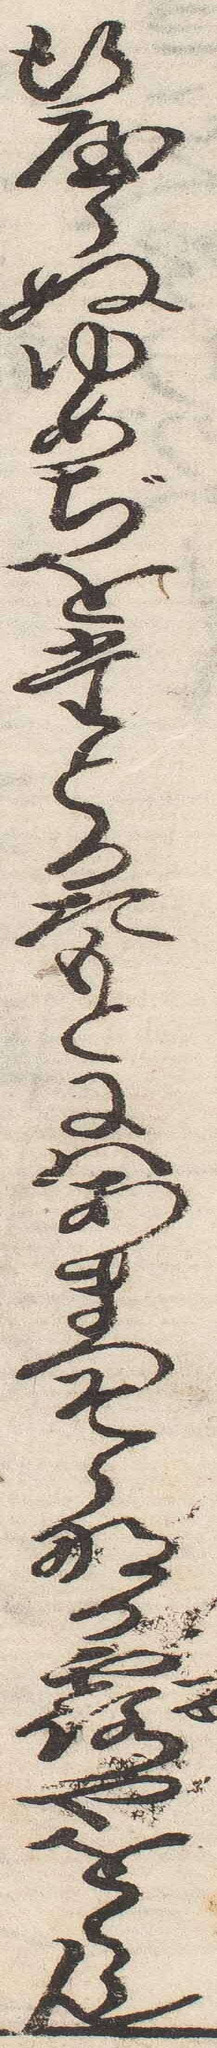行やらぬゆめぢをたとるたもとにはあまつそらなる露やをくらん
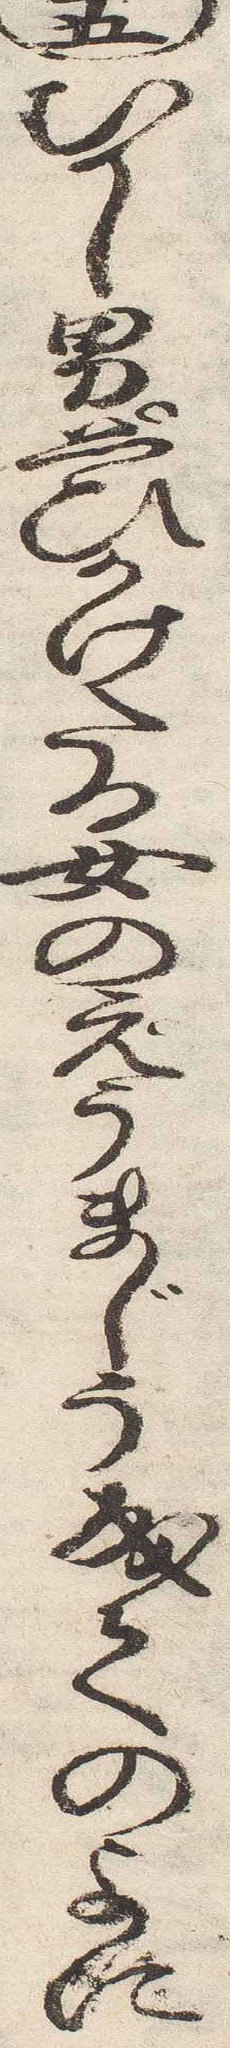五十五むかし男。思ひかけたる女のえうまじう成てのよに
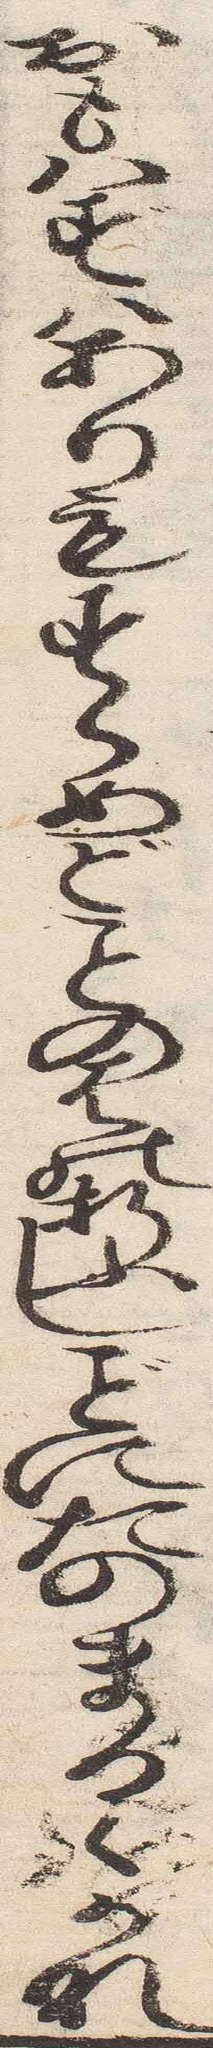おもはずはありもすらめどことのはの折ふしごとにたのまるゝかな

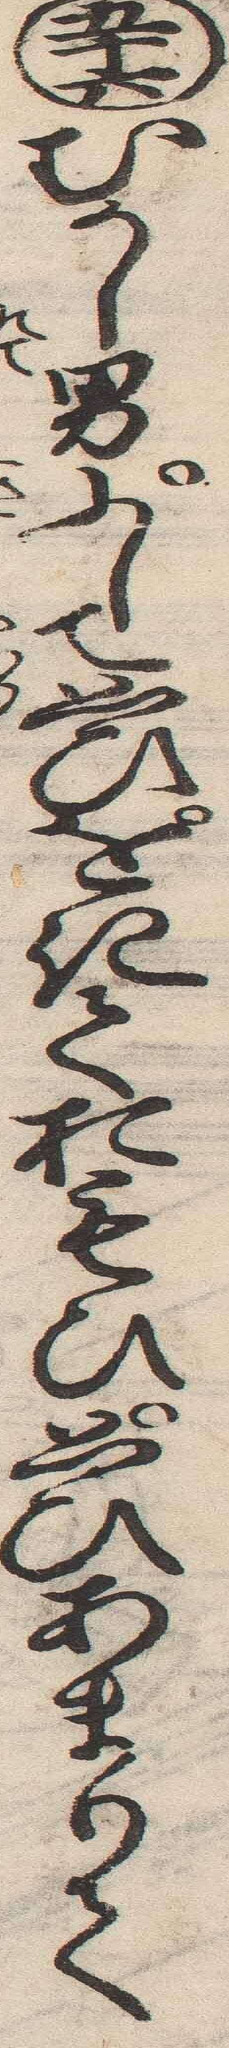五十六むかし男。ふして思ひ。をきておもひ。思ひあまりて
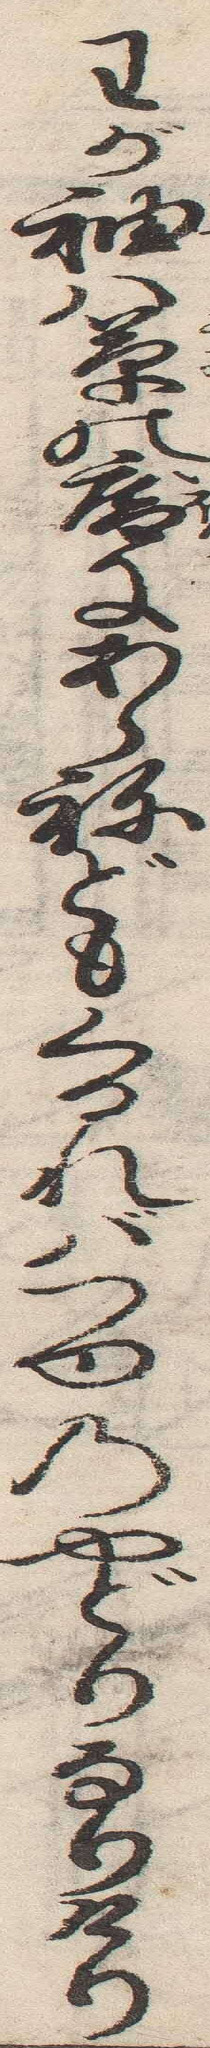わが袖は草の庵にあらねどもくるればつゆのやどりなりけり
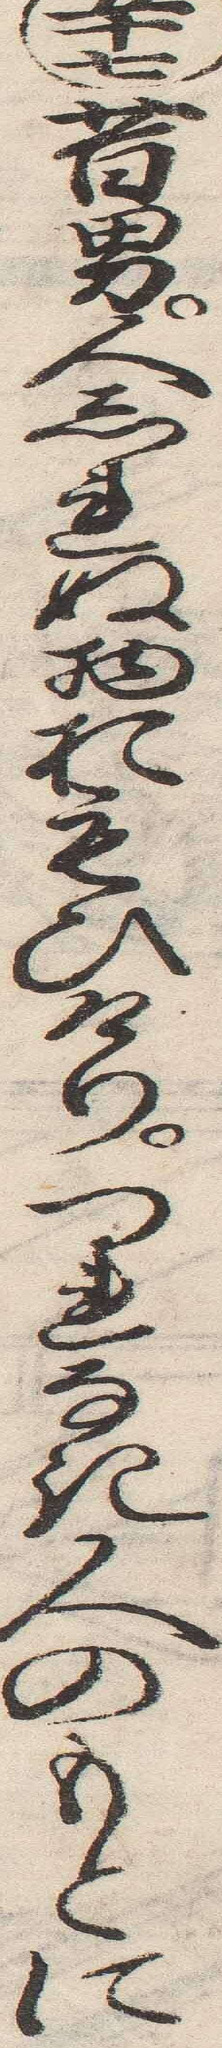五十七昔男。人しれね物おもひけり。つれなき人のもとに
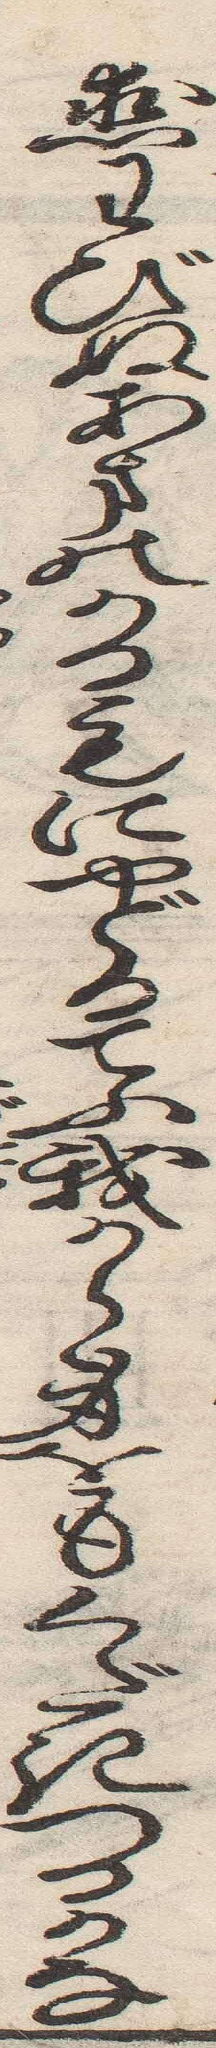恋わびぬあまのかるもにやどるてふ我から身をもくだきつるかな
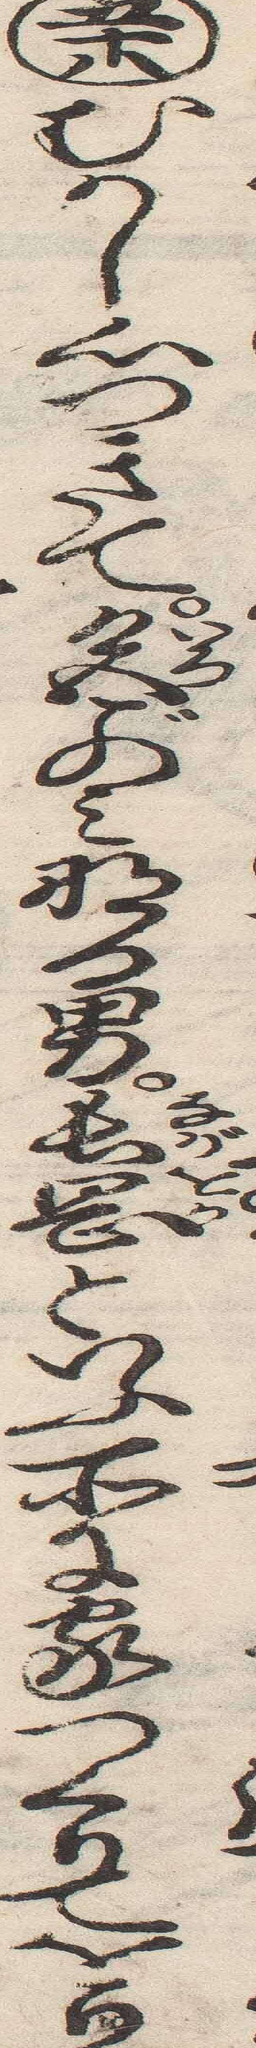五十八むかし心つきて。色ごのみなる男。長岡といふ所に家つくりてをり
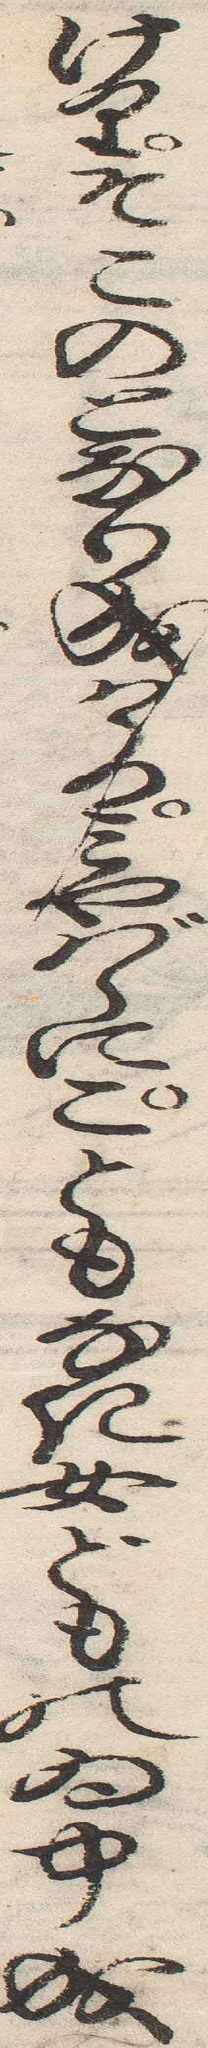けり。そこのとなり成ける。みやばらに。こともなき女どものゐ中成
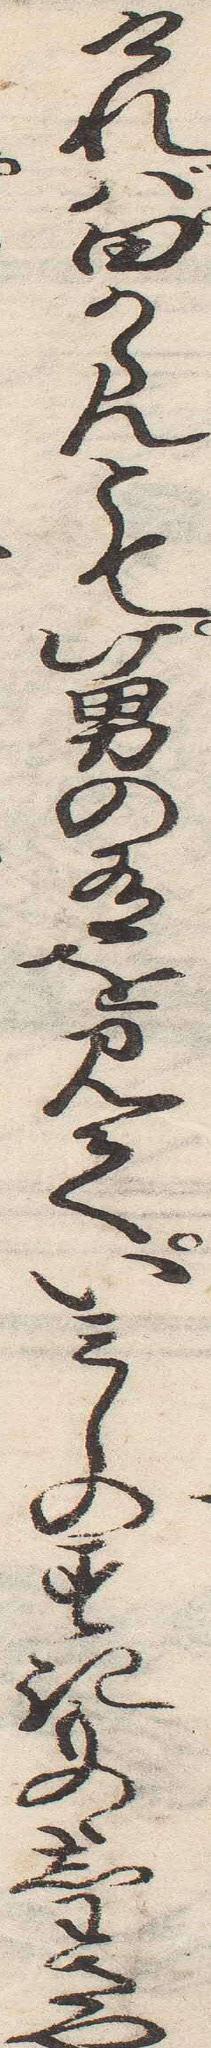ければ。田からんとて。此男の有を見て。いみしのすきものゝしわさや
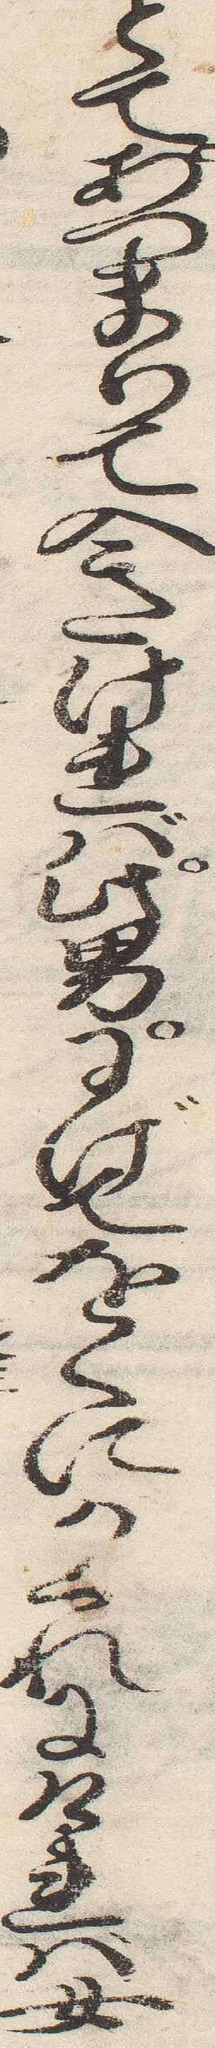とて。あつまりて入りきければ。此男。にげてをくにかくれにければ女
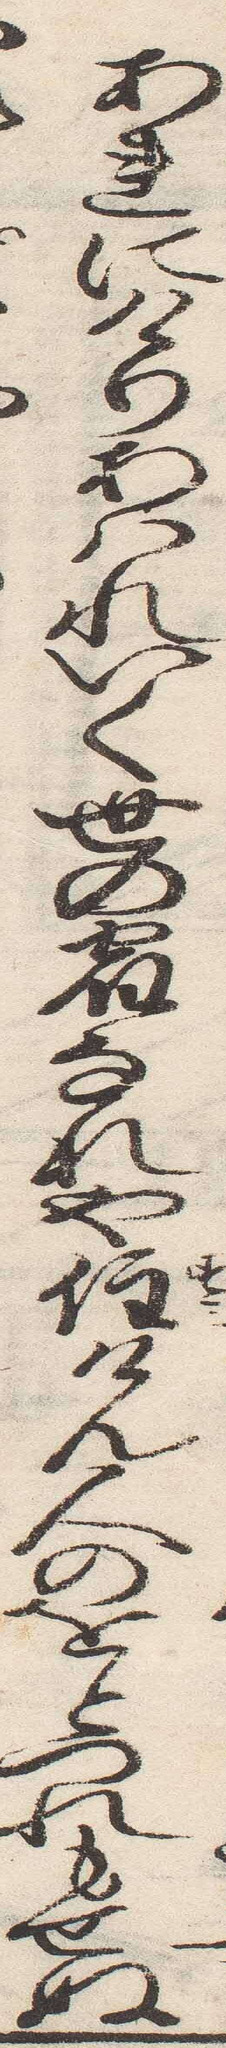あれにけりあはれいく世の宿なれや住けん人のをとつれもせぬ
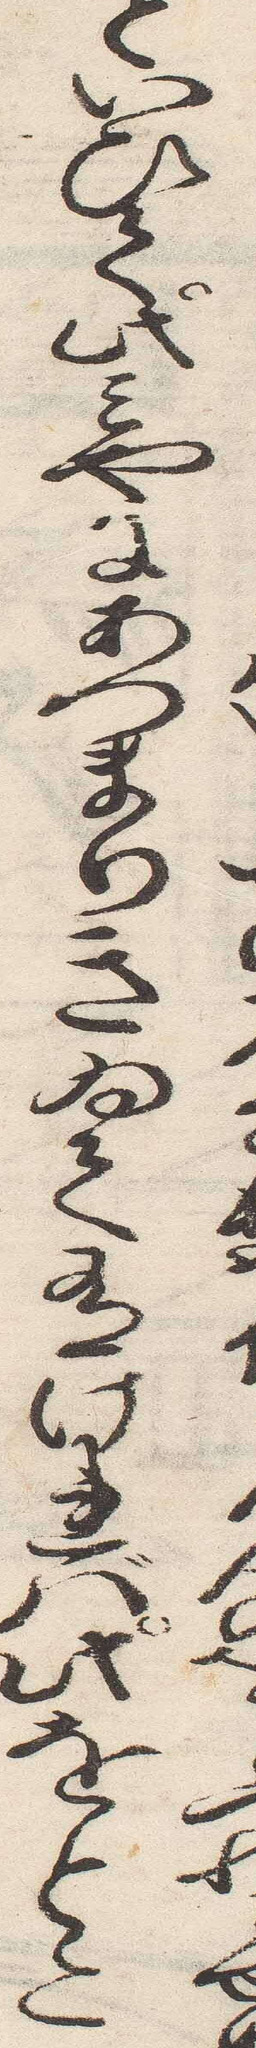といひて。此みやにあつまりきゐて有ければ。此おとこ
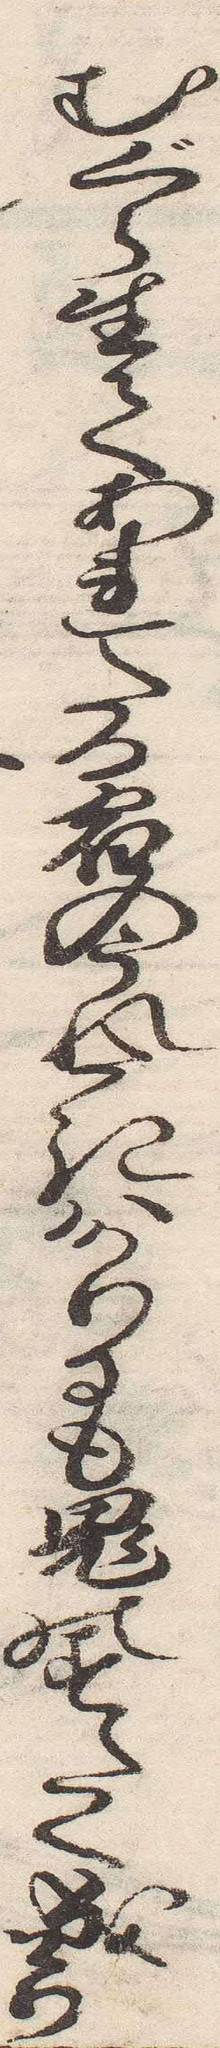むぐら生てあれたる宿のうれたきはかりにも鬼のすたく成けり
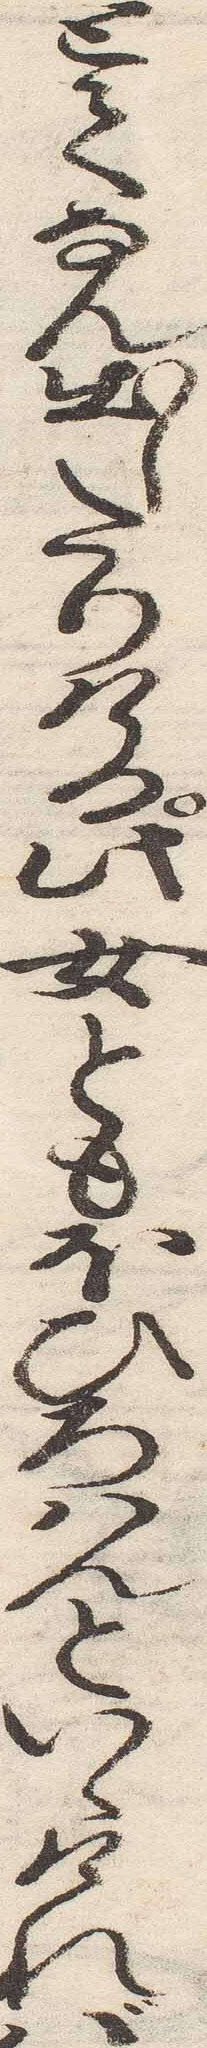とてなん出したりける。此女ともほひろはんといゝければ
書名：伊勢物語
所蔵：東京学芸大学附属図書館 国文学研究資料館
